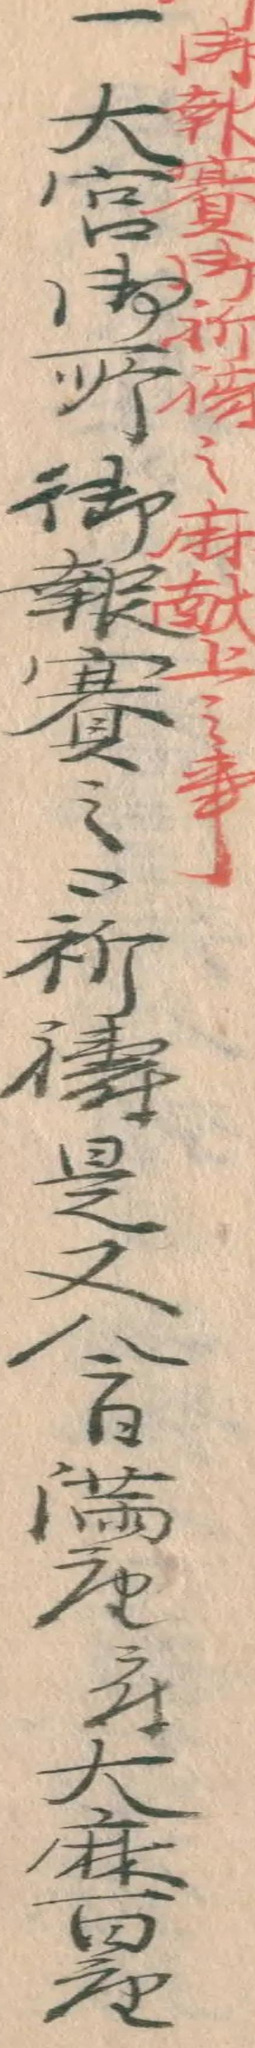一大宮御所御報賽之御祈祷是又今日満座ニ付大麻百座
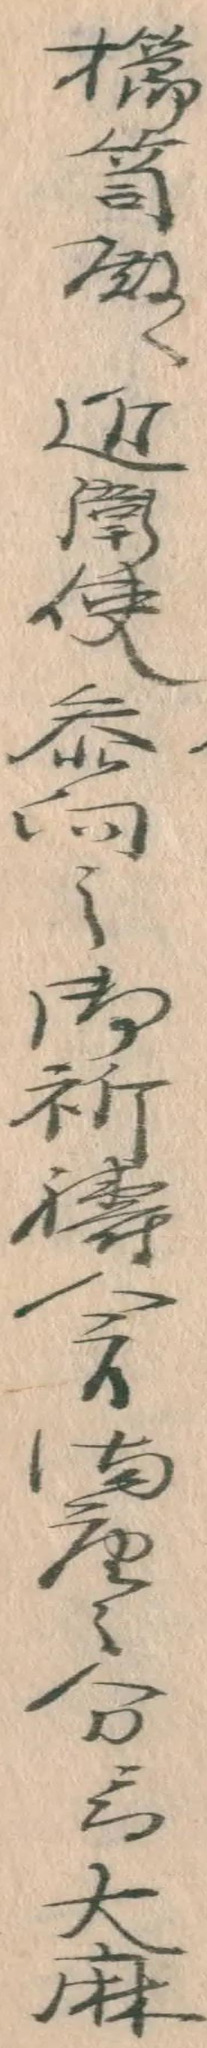櫛笥殿へ近衛使参向之御祈祷今日満座之分ニ而大麻
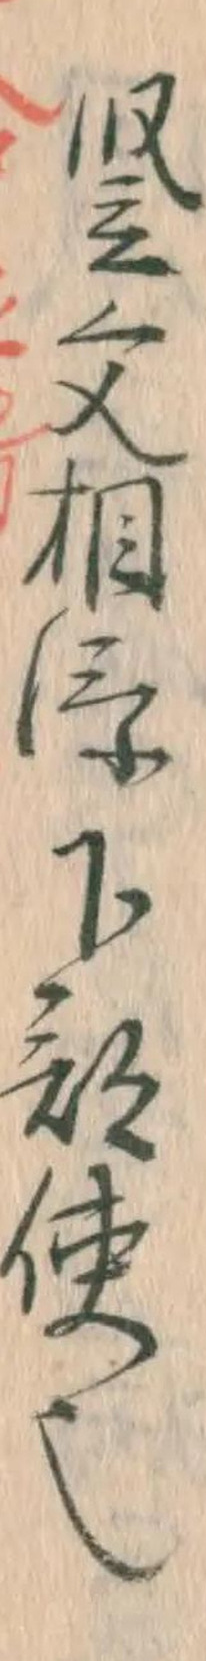竪文相添下部使也
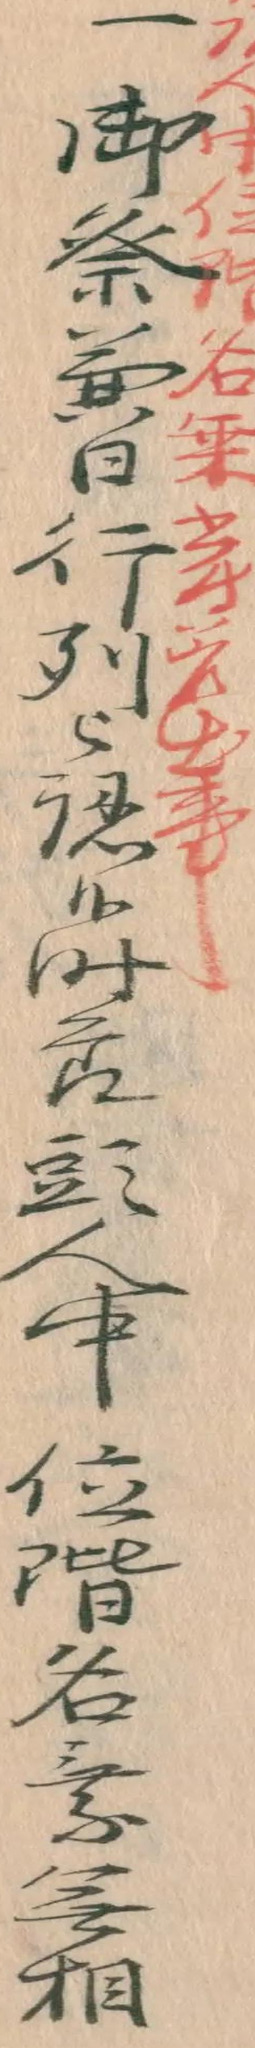一御祭兼日行列被認候時節頭人中位階名乗無相
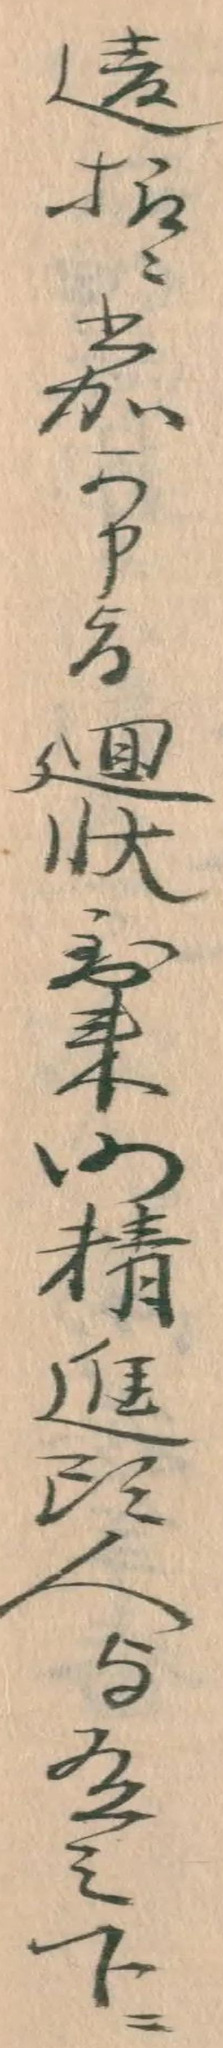違様ニ書加可申旨廻状到来仍精進頭人と有之下ニ
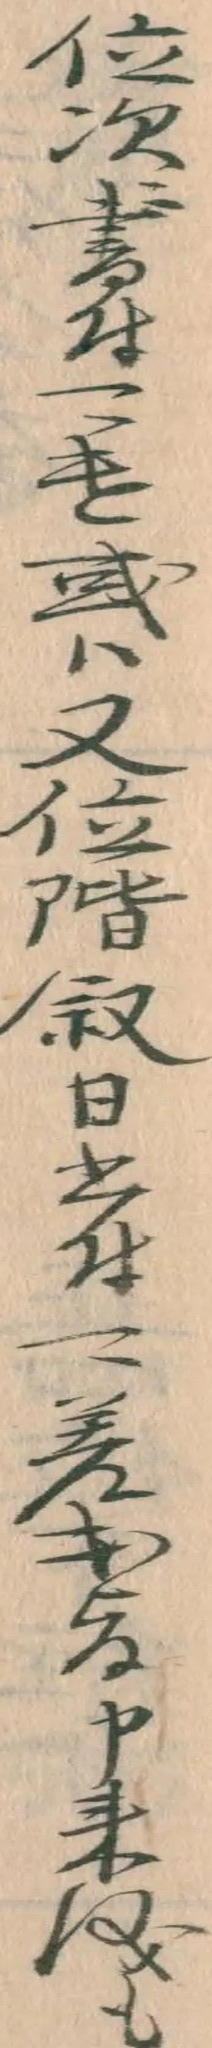位次に書付可遣或ハ又位階叙日書付差出旨申来儀も
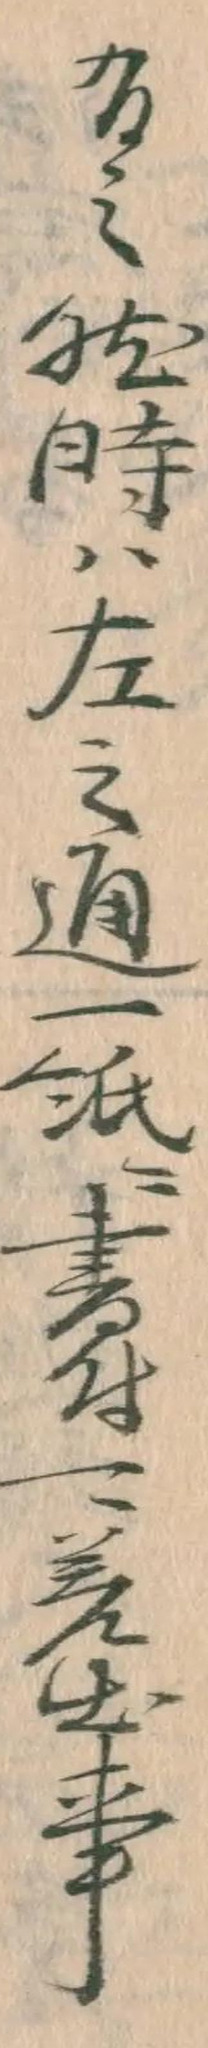有之然時ハ左之通一紙ニ書付可差出事
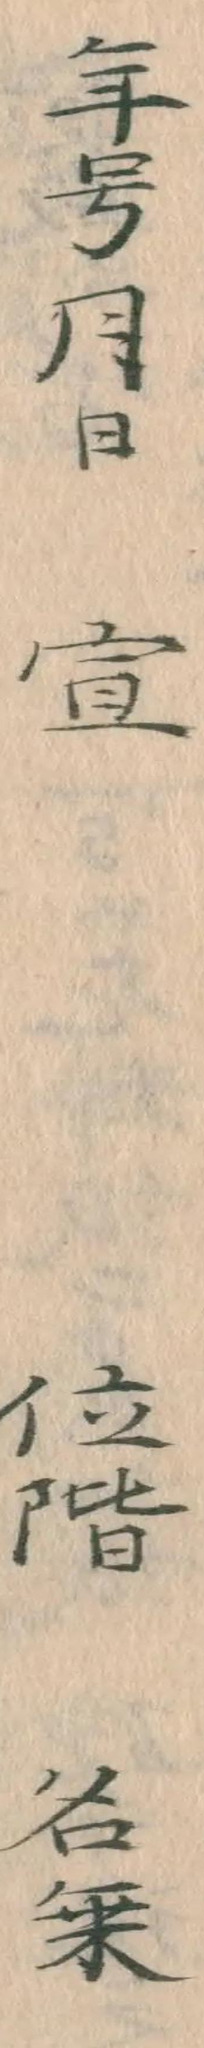年号月日宣位階名乗
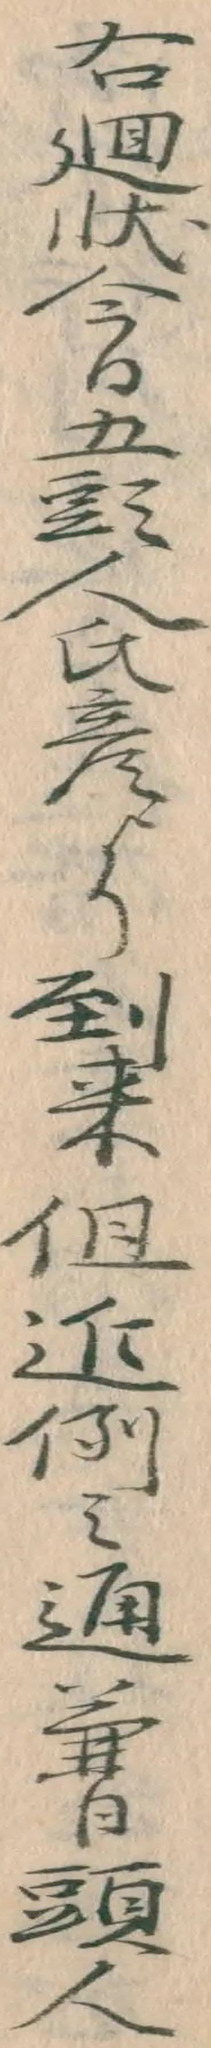右廻状今日五頭人氏彦より到来但近例之通兼日頭人
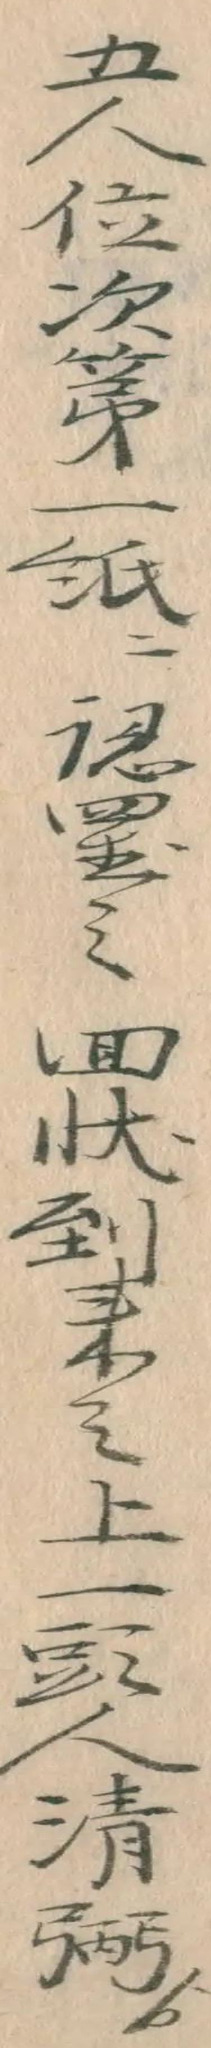五人位次第一紙ニ認置之回状到来之上一頭人清弼ゟ
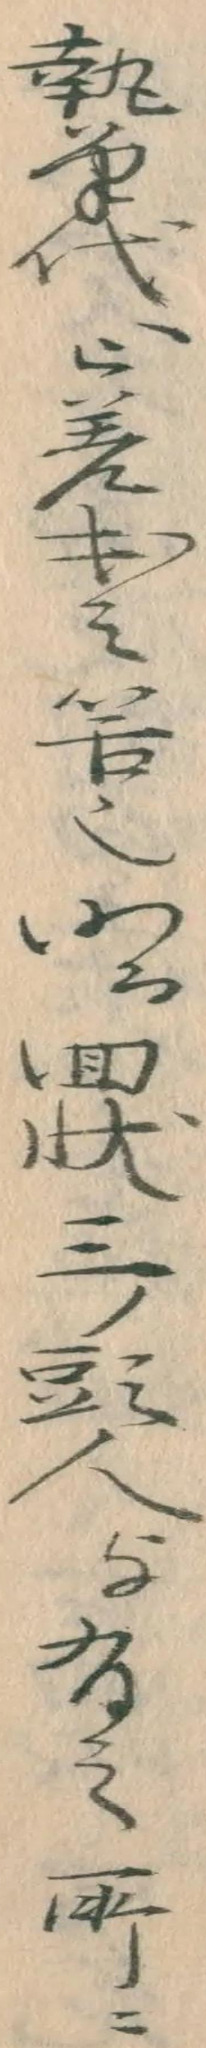執筆代へ被差出之筈也仍而回状三ノ頭人と有之所ニ

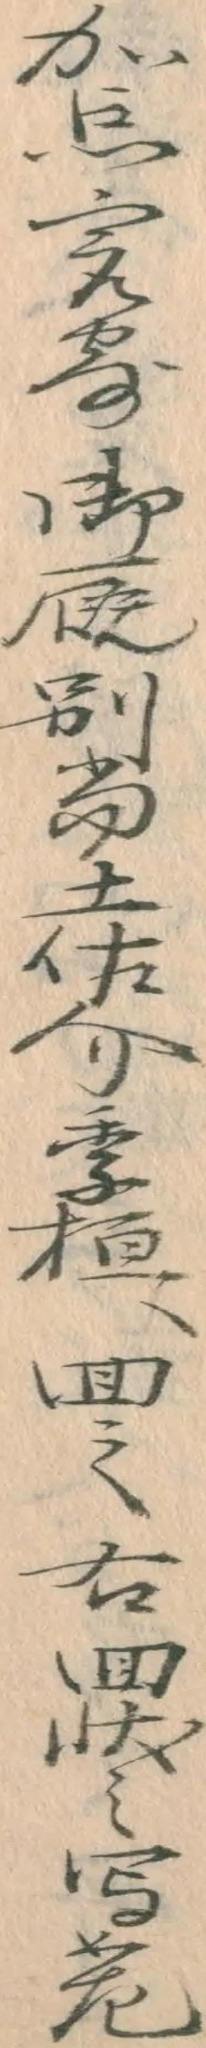加点最寄御厩別當土佐介季桓へ回之右回状之写如左
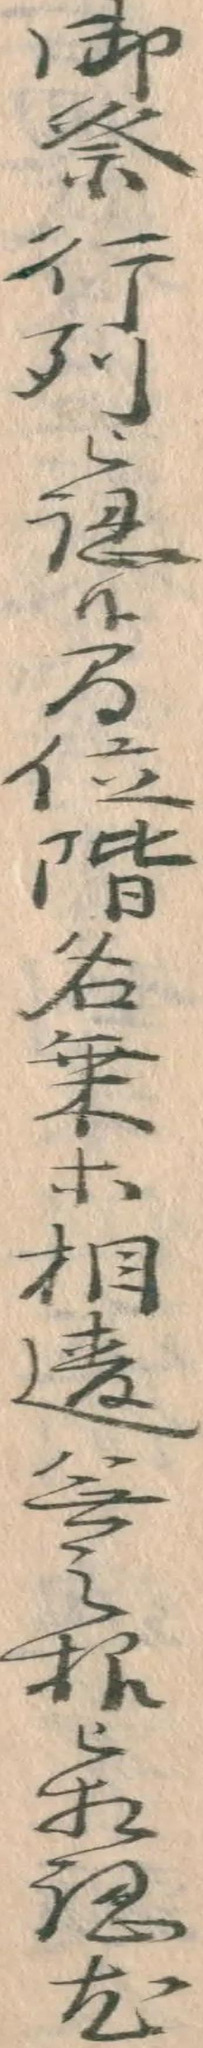御祭行列被認候間位階名乗等相違無之様被相認尤
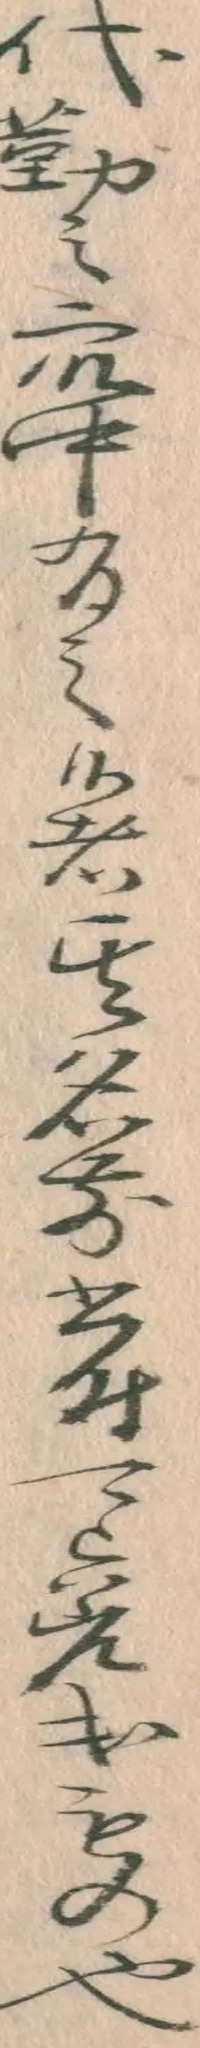代勤之衆中有之候者其名前書付可被差出もの也
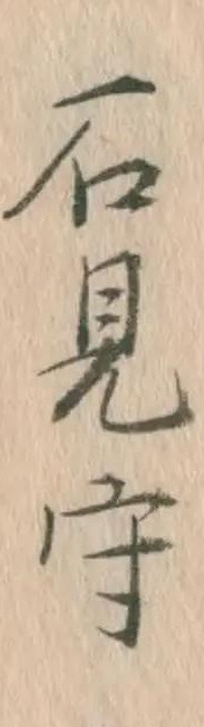石見守
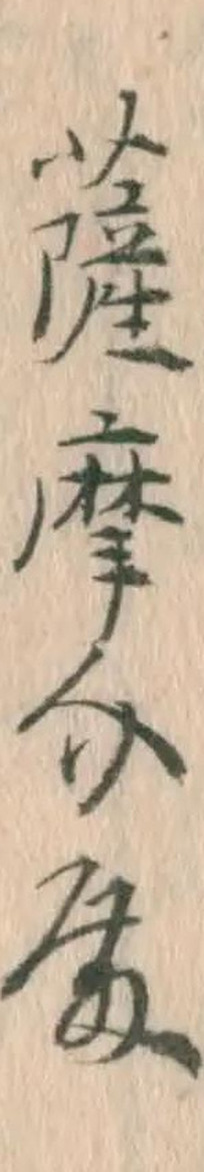薩摩介殿
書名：賀茂社記録. 第73冊
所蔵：国立国会図書館 National Diet Library, JAPAN
